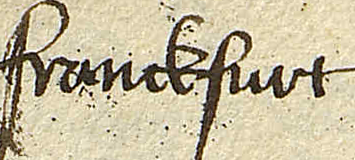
Frankfurt
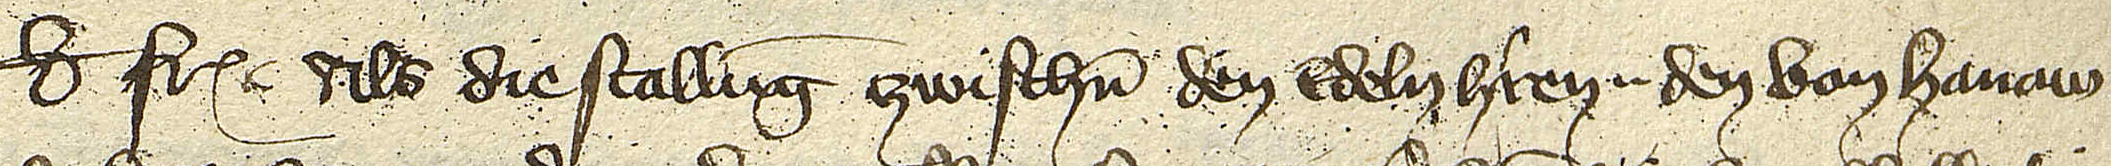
L* fr* / Als die ſtallug* cʒwiſchn* den Edeln hr*en ~ den von hanaw
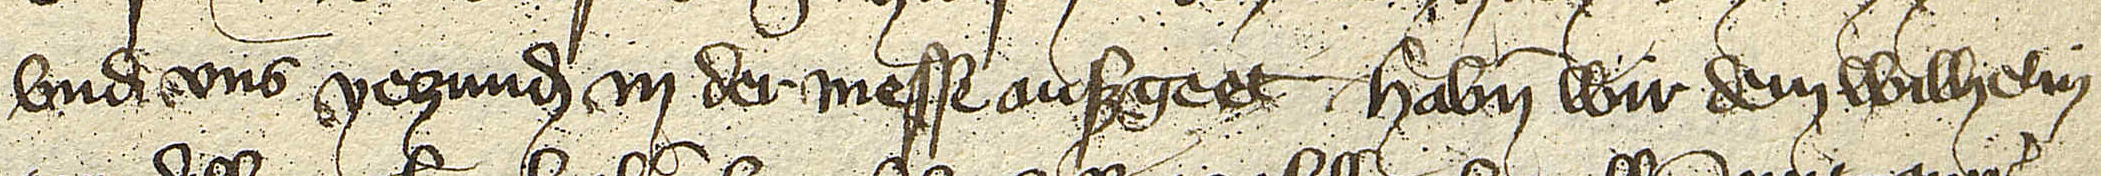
vnd vns yecʒund* in der meſſe auſʒgeet / habn* wir dem wilhelm
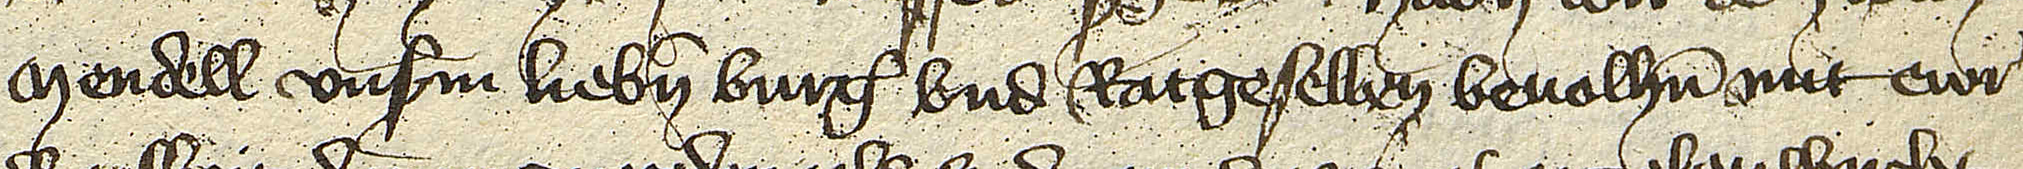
Mendell vnſ*m liebn* burg* vnd Ratgeſellen beuolhn* mit ewr*
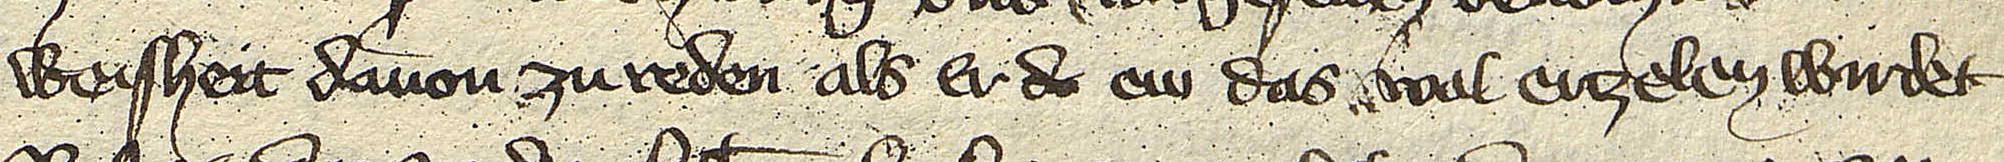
weiſheit dauon cʒu reden als Er d ew das wol ercʒelen wirdet
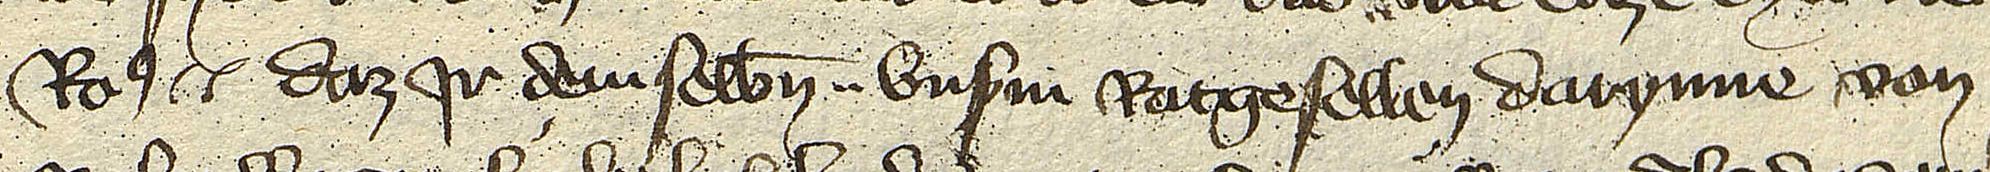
Ro* // daʒ Ir dem ſelbn* ~ vnſ*m Ratgeſellen darynne von
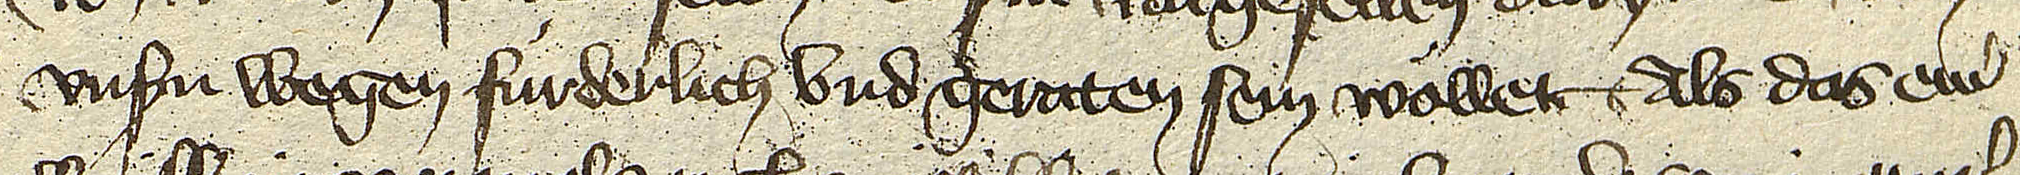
vnſ*n wegen fürderlich vnd geraten ſein wöllet / Als das ew*
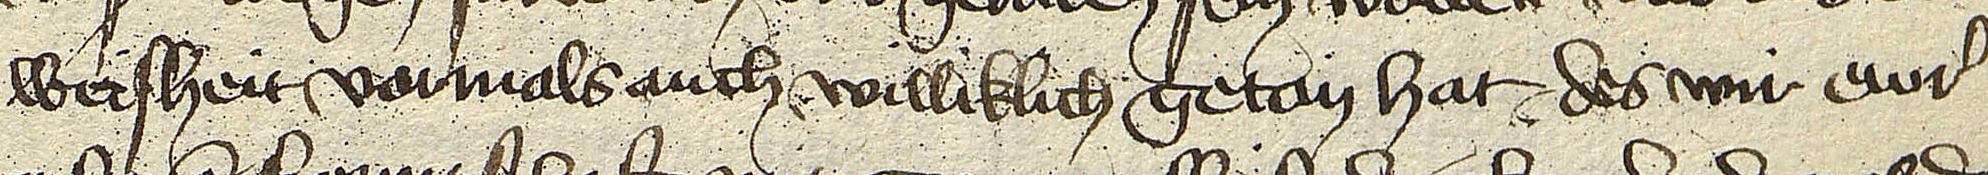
weiſheit vormals auch williklich getan hat / des wir ewr*
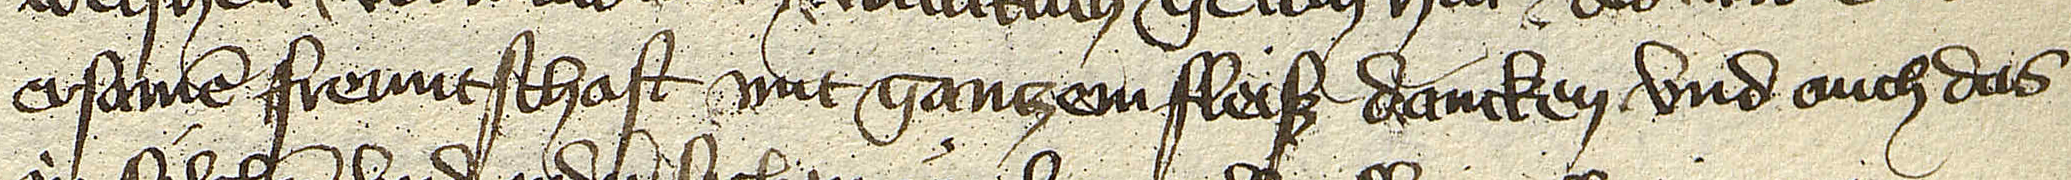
erſame* freuntſchaft mit gancʒem fleiſʒ dancken / vnd auch das
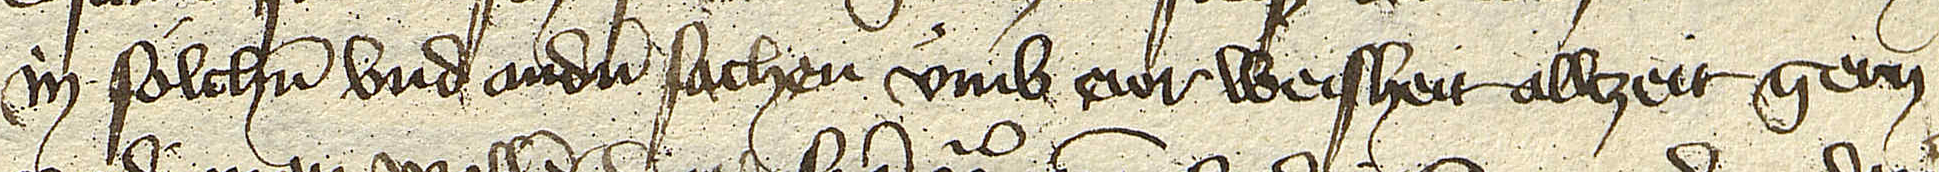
in ſolchn* vnd andn* ſachen v̈mb ewr weiſheit allcʒeit gern
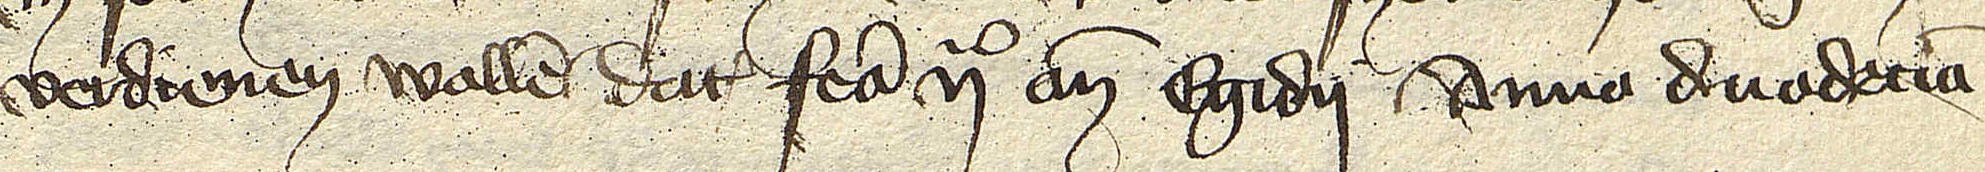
verdienen wolle* dat* fea* ii* an* Egidii / Anno duodecio*
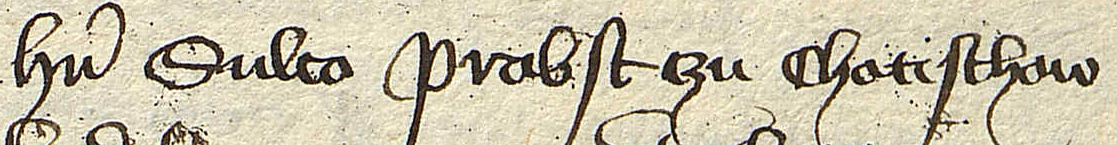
hn* Sulto probſt cʒu Chotiſchaw
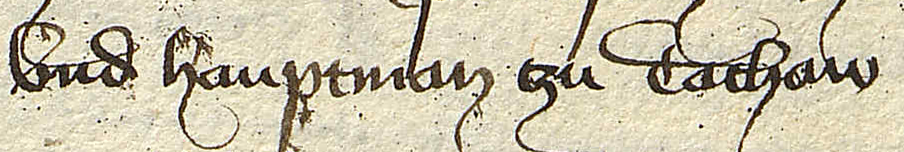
vnd hauptman cʒu Tachaw
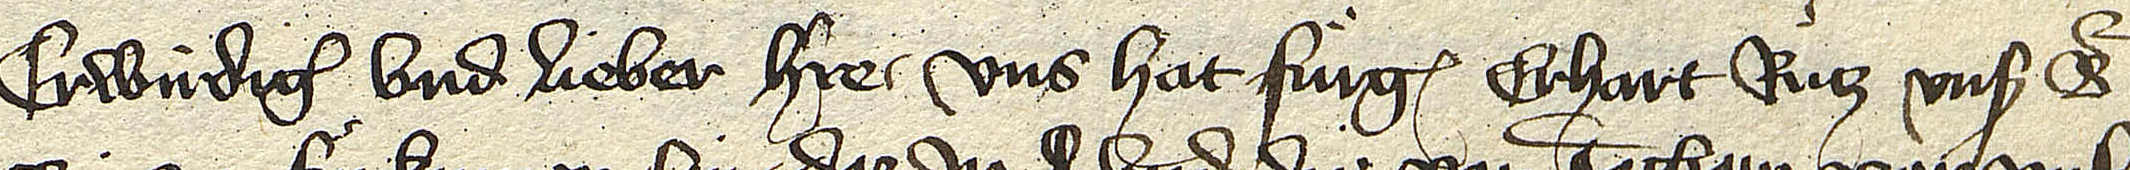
Erwirdig* vnd lieber h*re / vns hat fürg* Erhart Rucʒ vnſ* B*
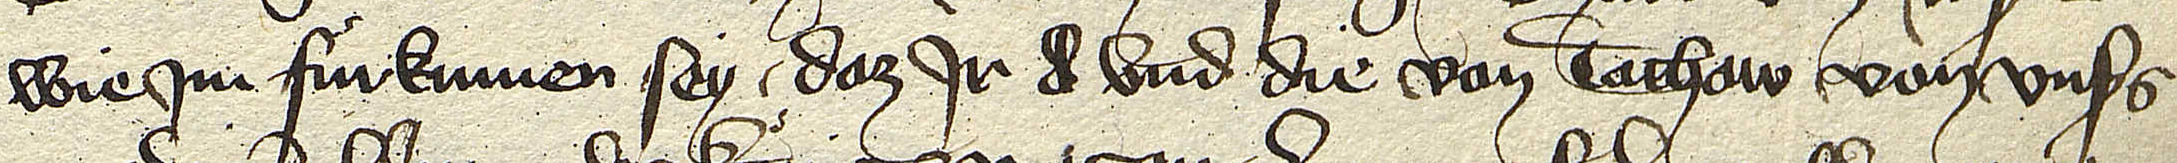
wie Im fürkumen ſey / daʒ Ir d vnd die von Tachaw von vnſ*s
